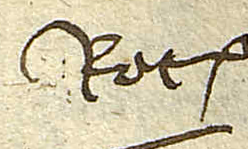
Rot*
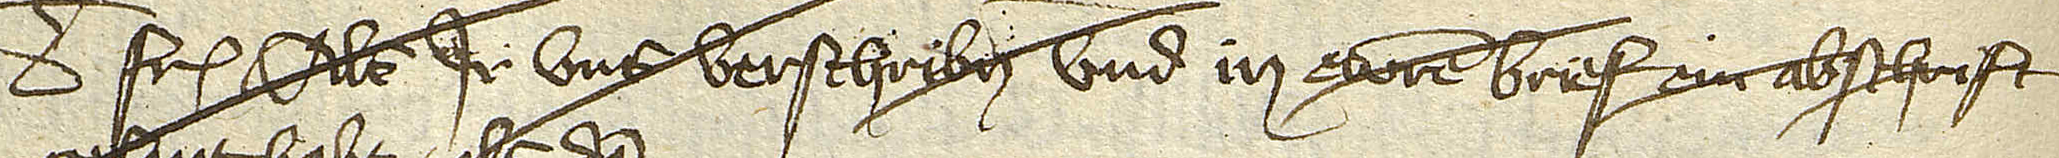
L* fr* / Als Ir vns verſchribn* vnd in ewre* brief ein abſchrift
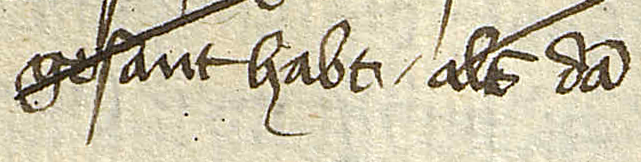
geſant habt / als da*
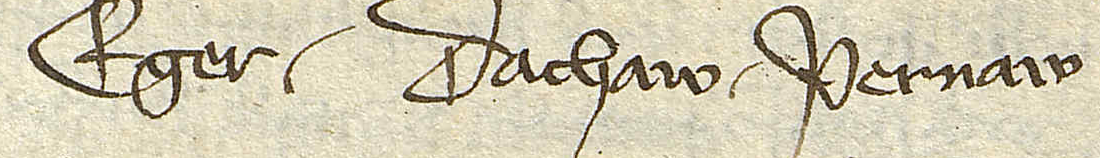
Eger / Dachaw / Pernaw
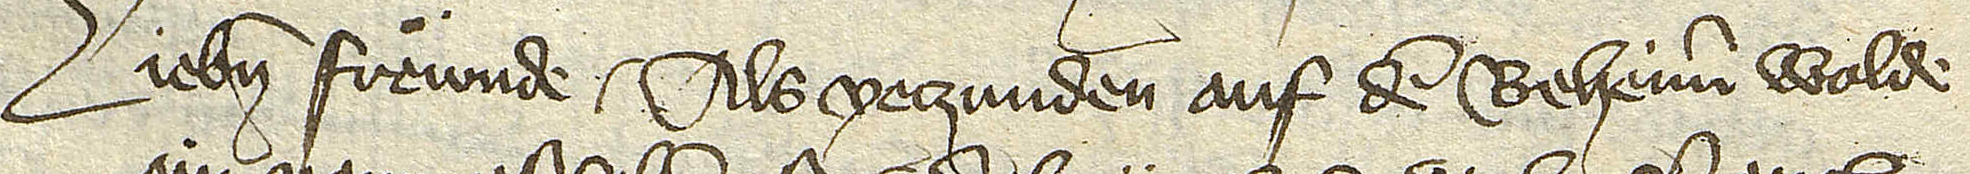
Liebn* frewnde / Als yecʒunden auf d* Beheim* walde
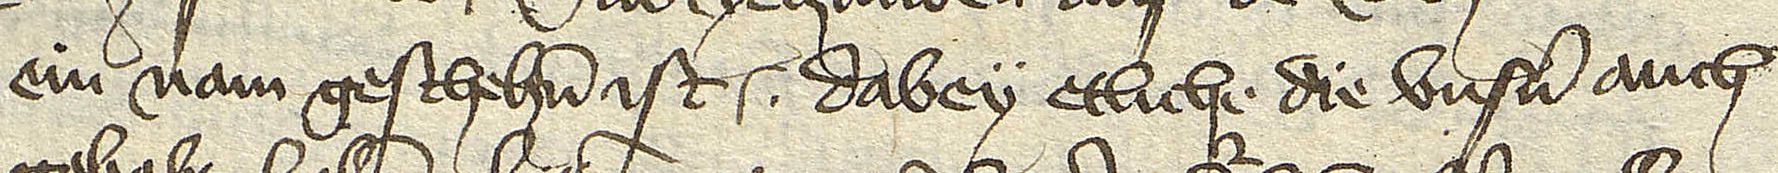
ein nam geſchehn* iſt / . dabey etliche die vnſn* auch
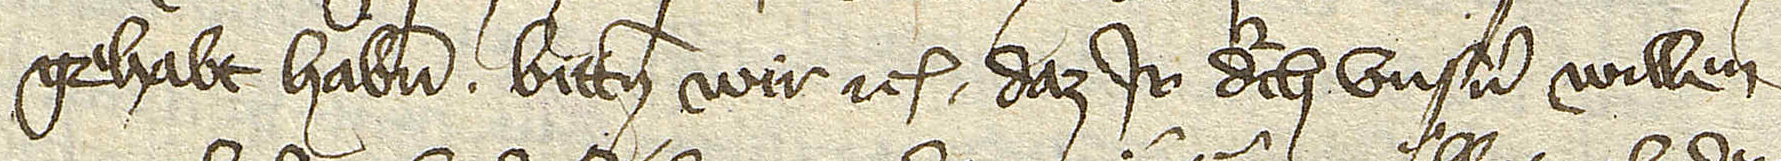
gehabt habn* . bittn* wir ec* / daʒ Ir d*ch vnſn* willen
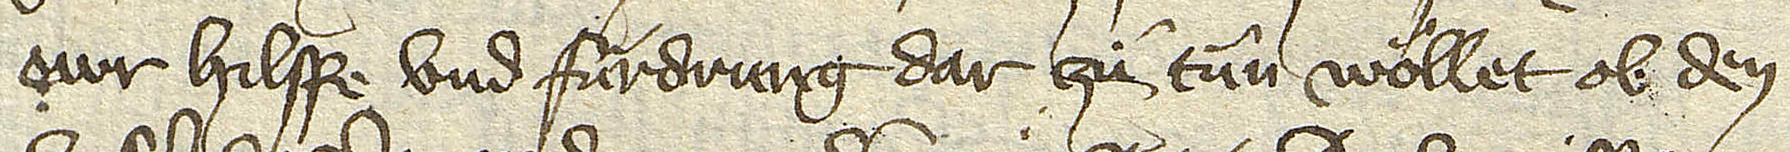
ewr hilffe vnd fürdrung dar cʒü tün wöllet ob den
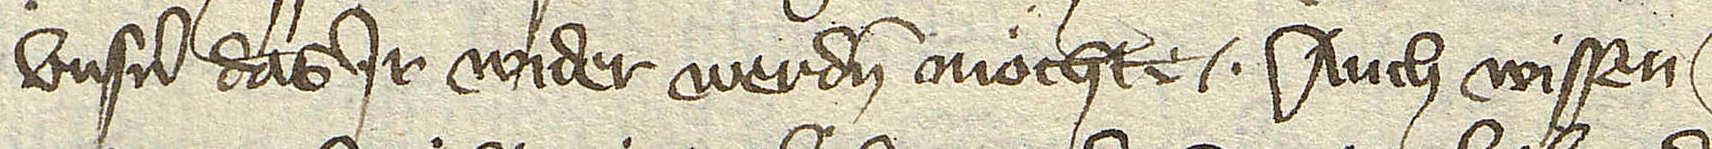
vnſn* das Ir wider werdn* möchte / . Auch wiſſen
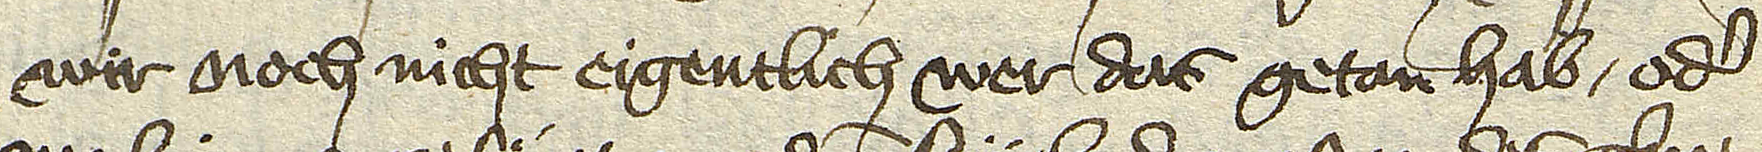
wir nich nicht eigentlich wer das getan hab / od*
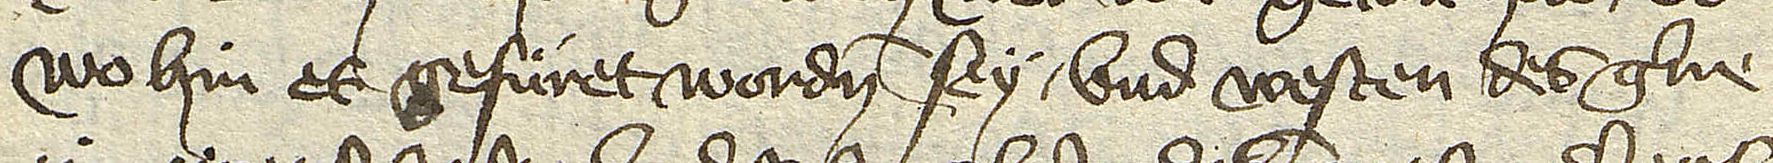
wo hin es gefüret wordn* ſey / vnd weſten des g*ne
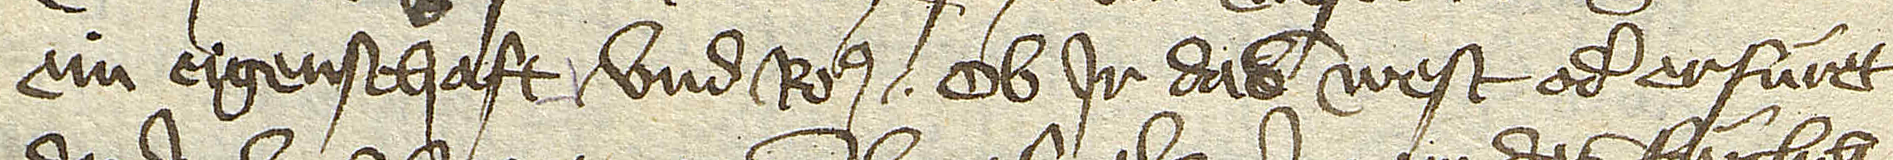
ein eigenſchaft / vnd Ro* / . Ob Ir das weſt od* erfüret
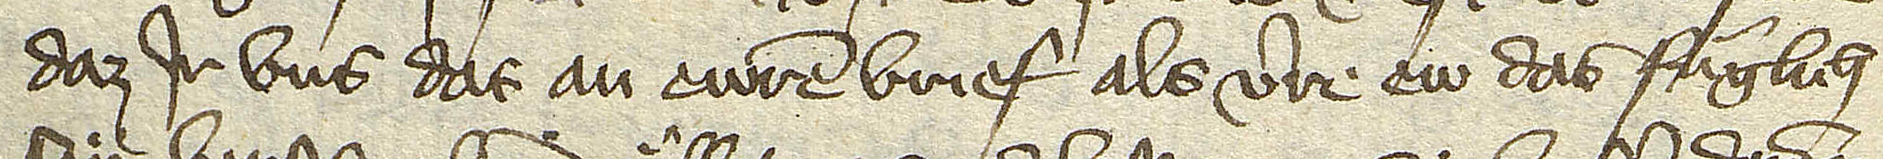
daʒ Ir vns das an ewre* brief als v*re ew das füglich
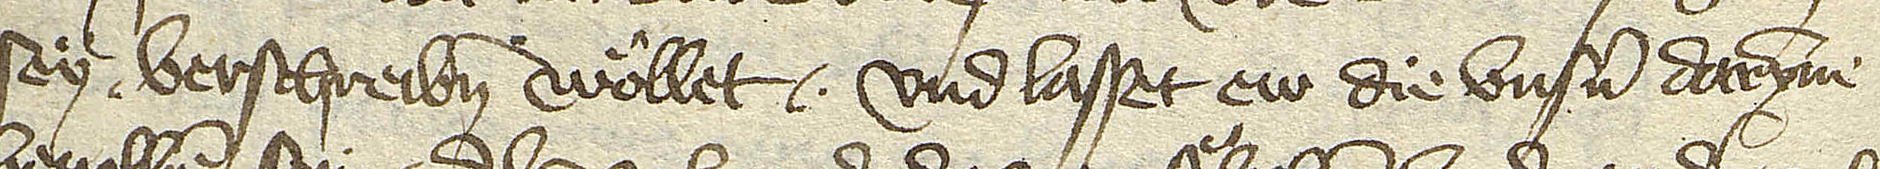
ſey / verſchreibn* wöllet / . vnd laſſet ew die vnſn* daryne*
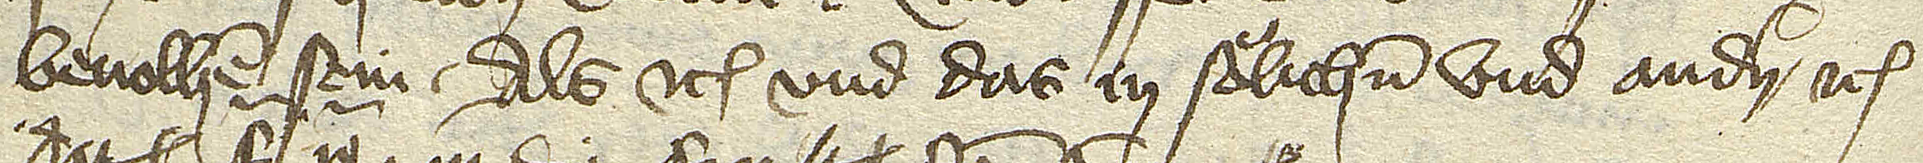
beuolhe* ſein / Als ec* vnd das in ſölichn* vnd andn* ec*
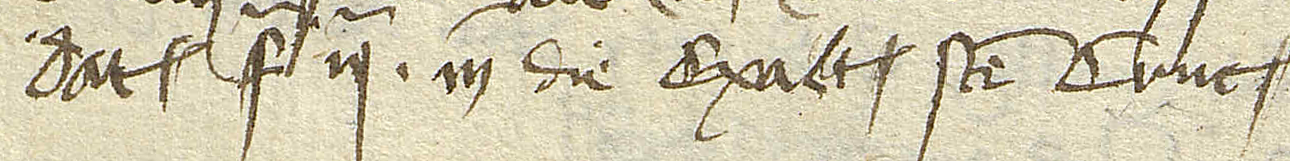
dat* f* ii*. in die Exalt* ſce* Cruc*
